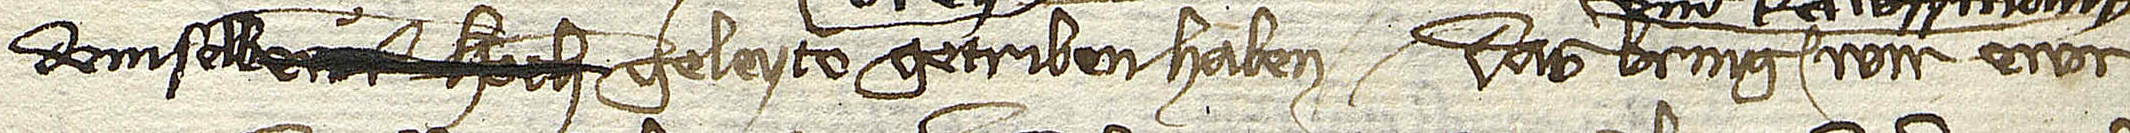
demſelb* ew*r hoch* geleyte getriben haben / Das bring* wir ew*r
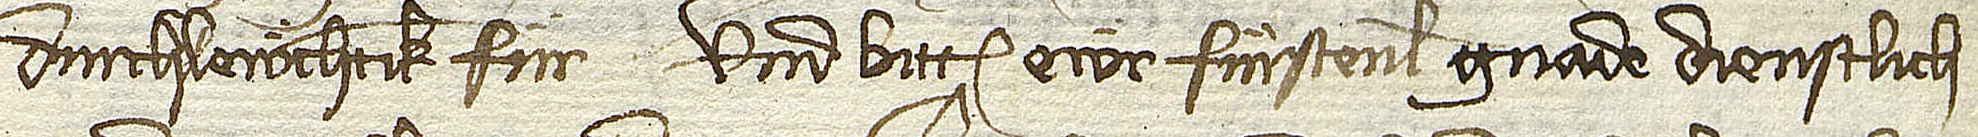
durchlewchtik* für / Vnd bitt* ewr fürſtenl* gnade dienſtlich
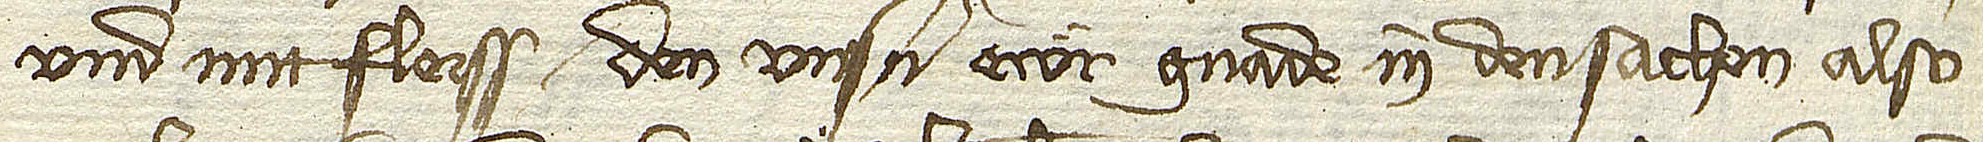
vnd mit fleiſſ / den vnſ*n ewr gnade in den ſachen alſo
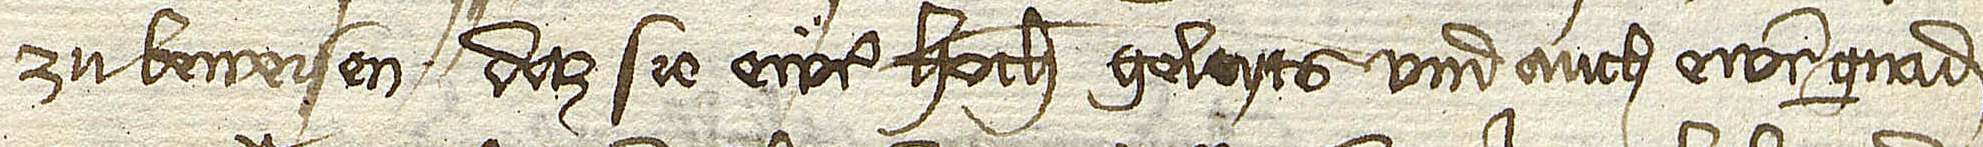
ʒu beweiſen . daʒ ſie ew*r hoch* geleyts vnd auch ew*r gnad*
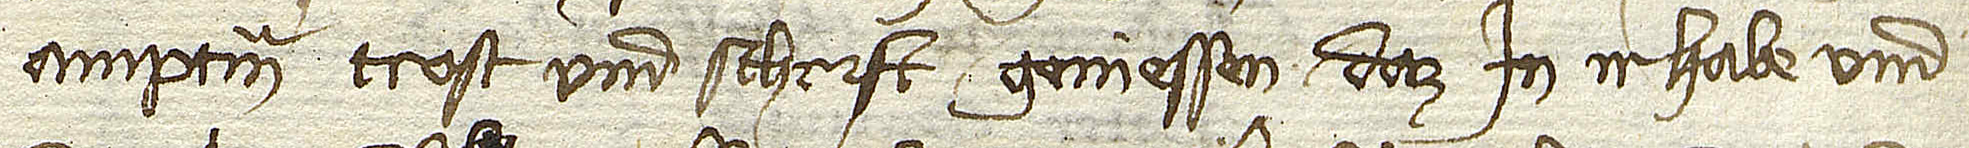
amptm* troſt vnd ſchrift genieſſen / daʒ In ir habe vnd
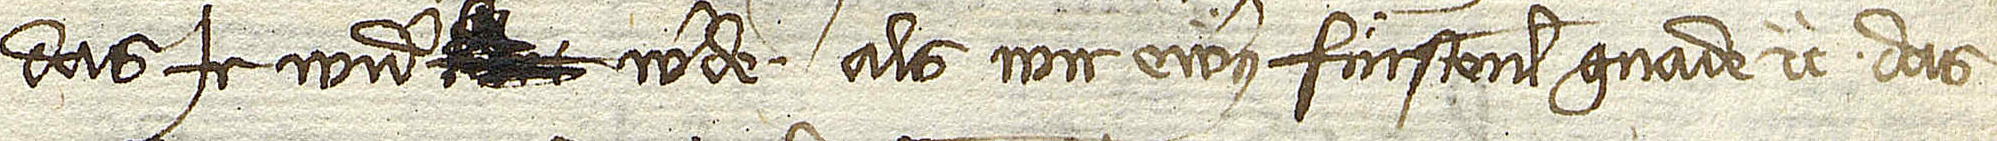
das Ir wid* kert w*de . als wir ew*n fürſtenl* gnade ec* . das
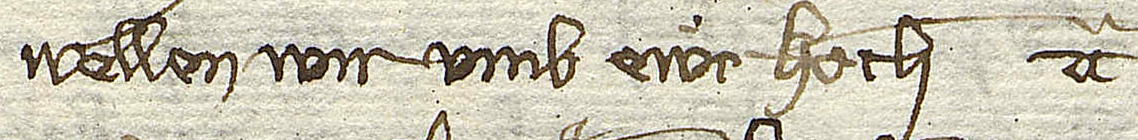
wellen wir vmb ewr hoch* ec*
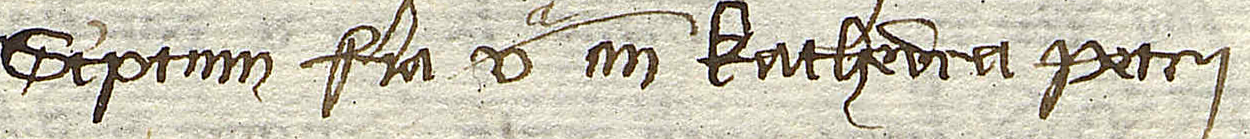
Sc*ptum fia* v* an* kathedra Petri
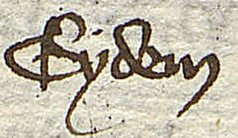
Eydem
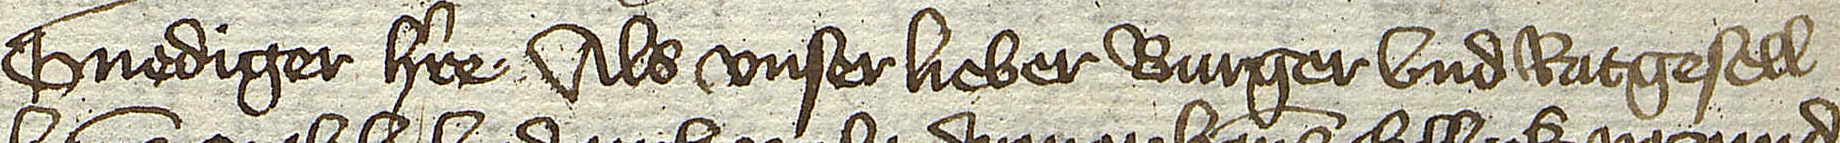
Gnediger h*re . Als vnſer lieber Burger vn Ratgeſell
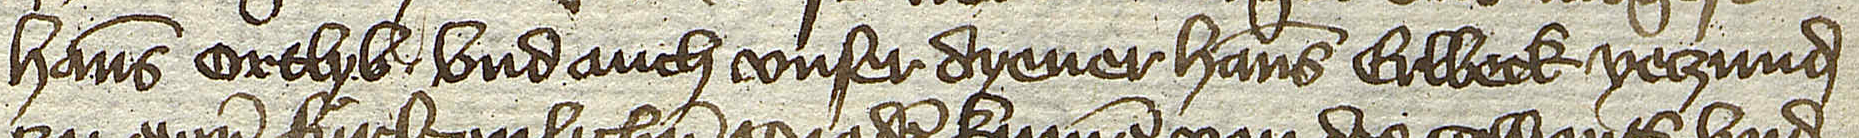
han*s ortlyb . vnd auch vnſer dyener han*s Erlbeck yecʒund*
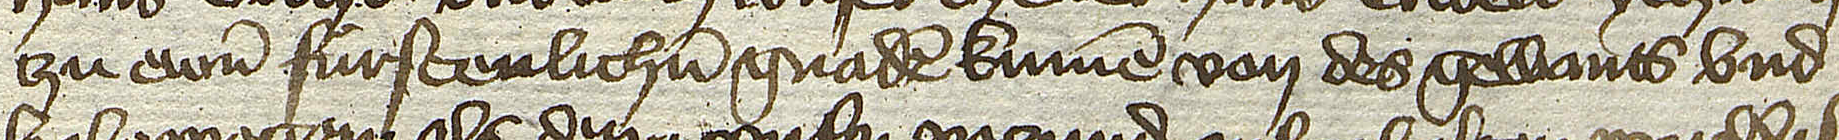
cʒu ew*n fürſtenlich*n gnade* kume* von des gewants vnd
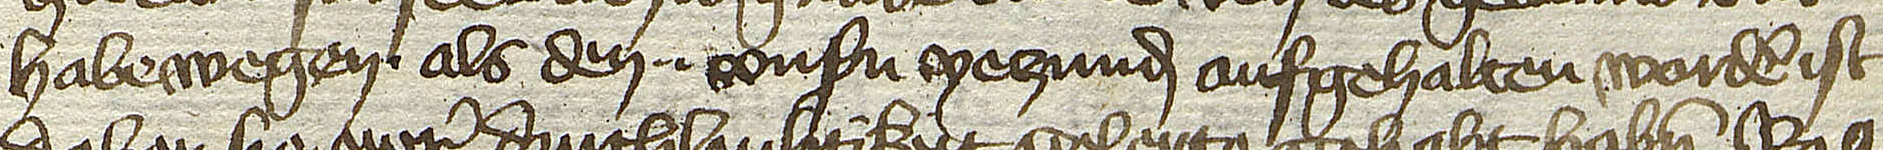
habe wegen . als den ~ vnſ*n yecʒund* aufgehalten worde* iſt
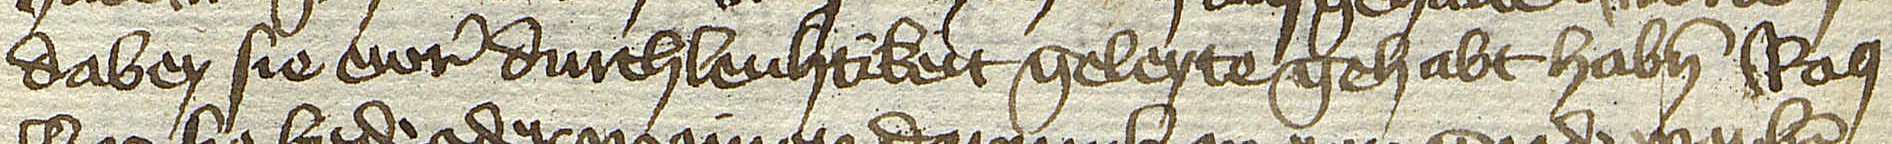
dabey ſie ew*r durchleuhtikeit geleyte gehabt hab*n Ro*
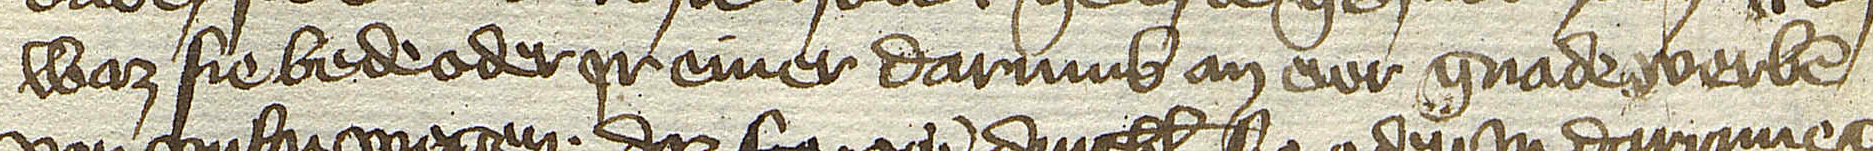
waʒ ſie bede oder Ir einer darumb an ewr gnade werbe*
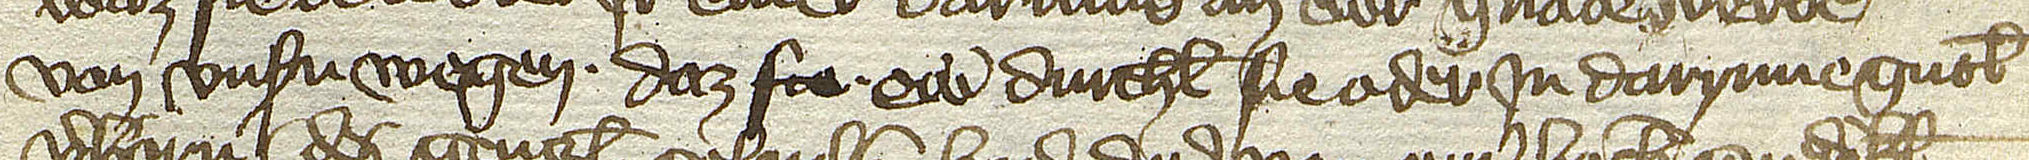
von vnſ*n wegen . daʒ ſie . ew* durchl* ſie oder In darynne gutl*
